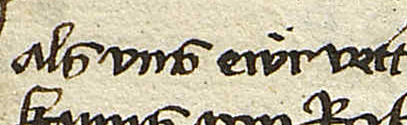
als vns ewr vett*
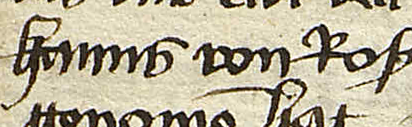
hanns von Roſ*
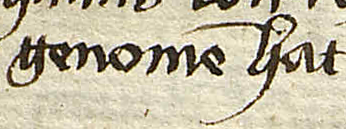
genome* hat
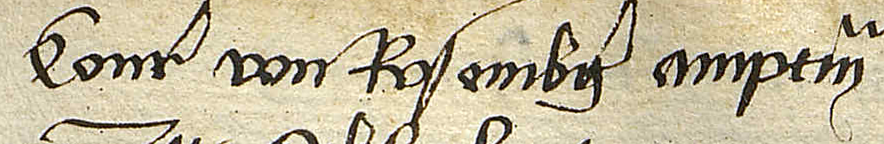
Conr* von Roſemb*g amptm*
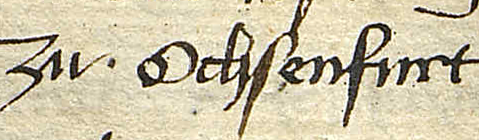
Ʒu . Ochſenfurt
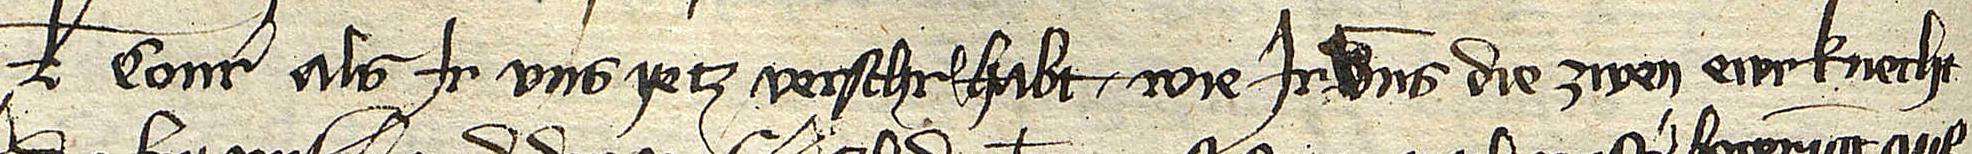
L* Conr* als Ir vns yecʒ verſchr* habt / wie Ir Vns die ʒwen ewr knecht
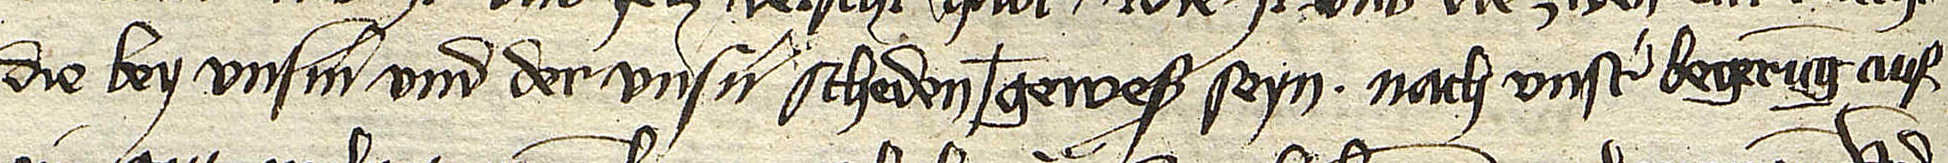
die bey vnſ*m vnd der vnſ*n ſcheden geweſ* ſeyn . nach vnſ*r begeru*g auf
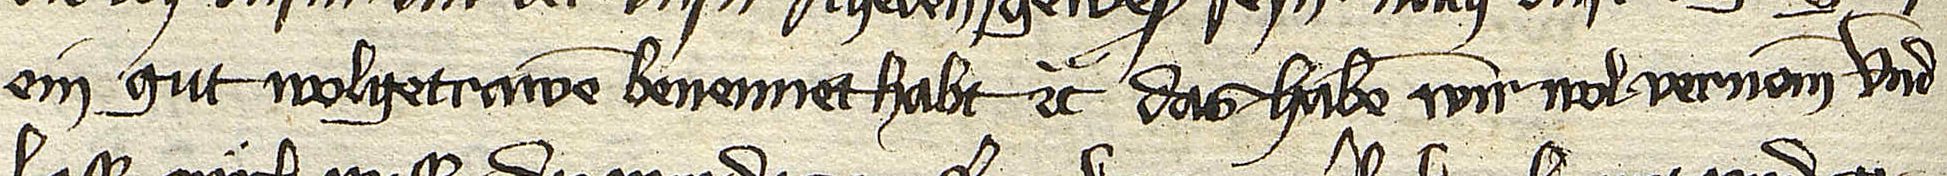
ein gut wolgetrawe* benennet habt ec* das habe* wir wol vernom* Vnd
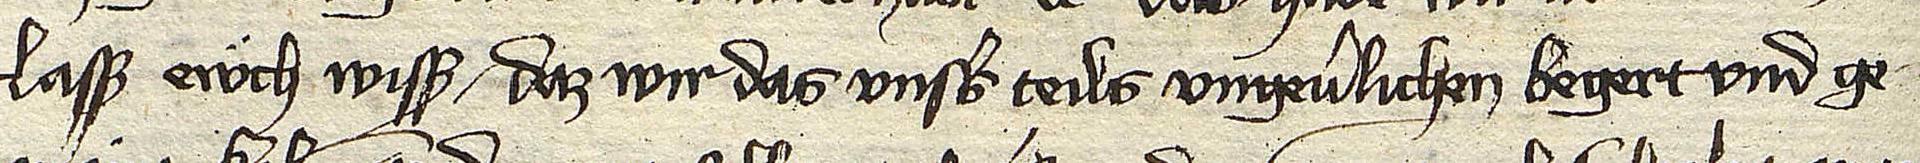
laſſ* ewch wiſſ* / daʒ wir das vnſ*s teils vngeu*lichen begert vnd ge =
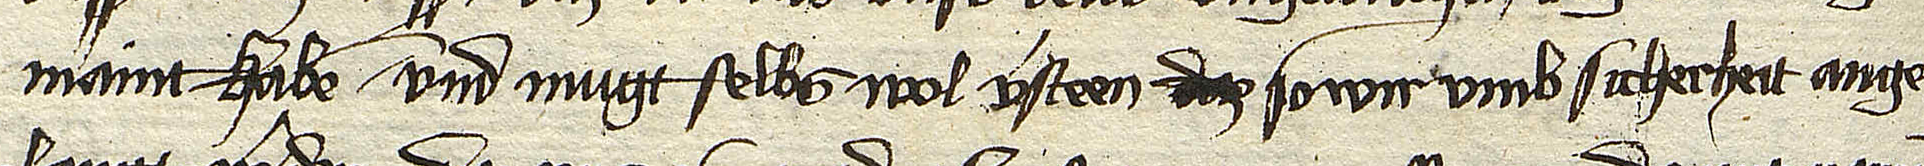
maint habe* / vnd mugt ſelbs wol v*ſteen daʒ ſo wir vmb ſicherheit ange
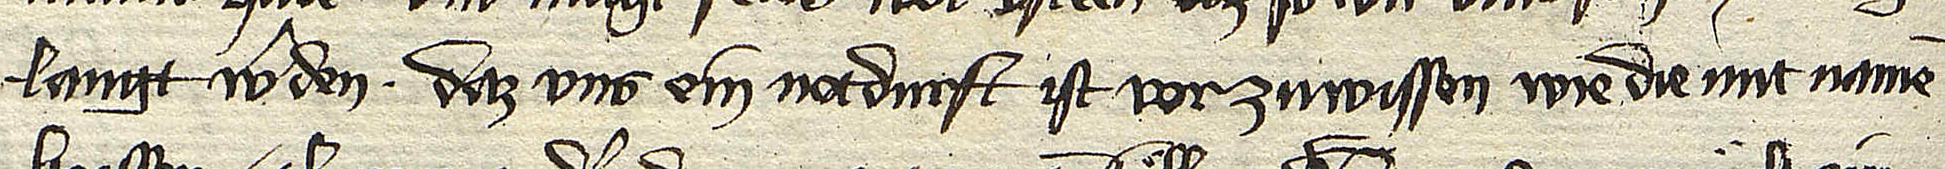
langt w*den . daʒ vns ein notdurft iſt vor ʒuwiſſen wie die mit name*
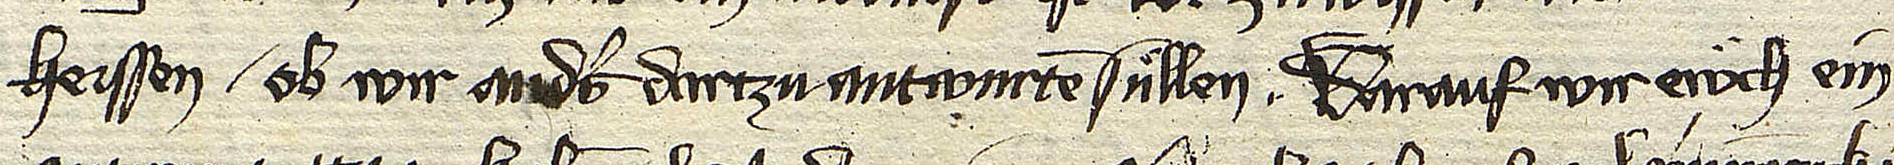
heiſſen / ob wir and*s darcʒu antwurte* ſüllen . Darauf wir ewch ein
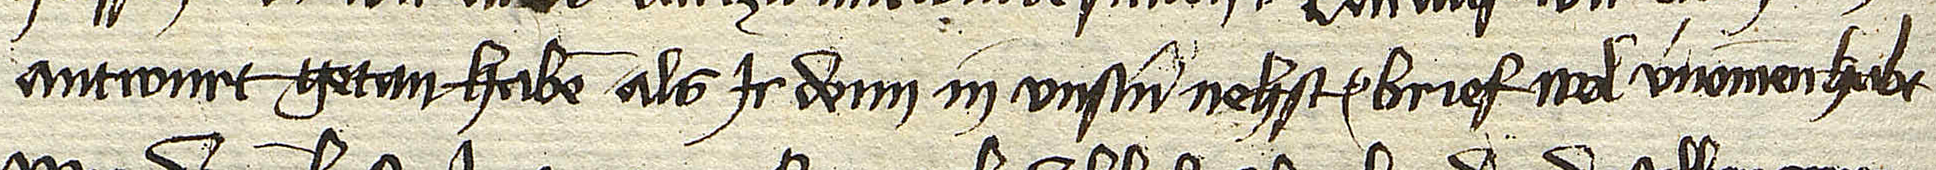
antwurt getan habe* / als Ir denn in vnſ*m nehſt* brief wol v*nomen habt
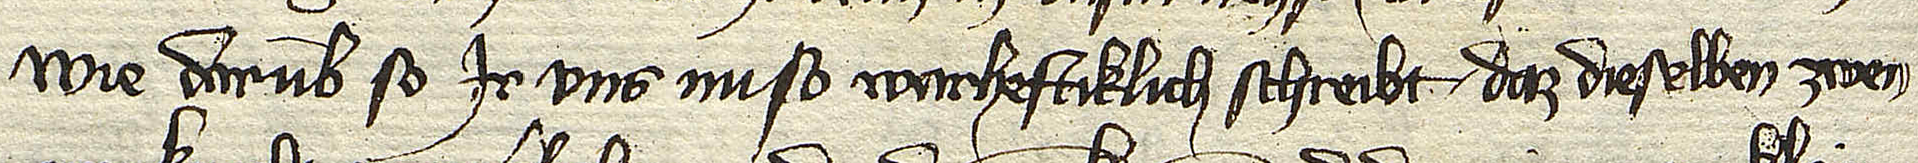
Wie daru*b ſo Ir vns nu ſo warheftiklich ſchreibt / daʒ dieſelben ʒwen
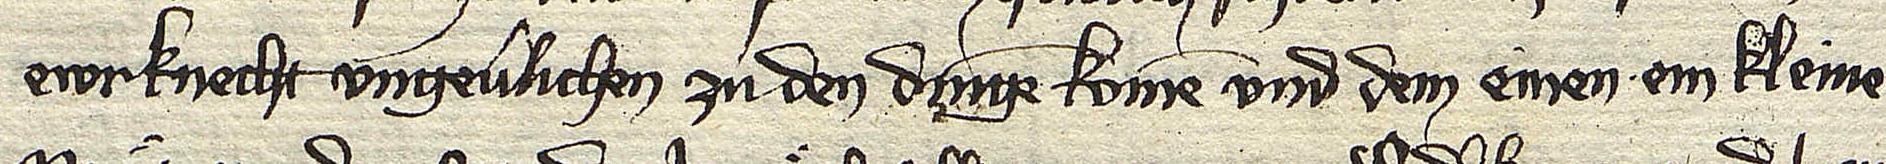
ewr knecht vngeu*lichen ʒu den dinge* kome* vnd dem einen . ein kleine
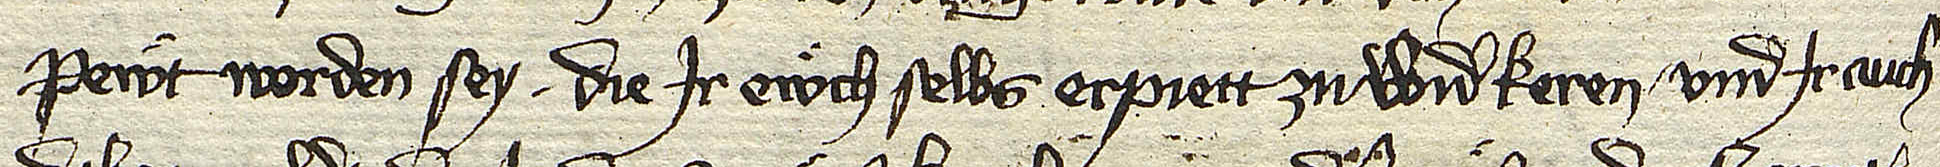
pewt worden ſey . die Ir ewch ſelbs erpiett ʒu Wid*keren / vnd Ir auch
